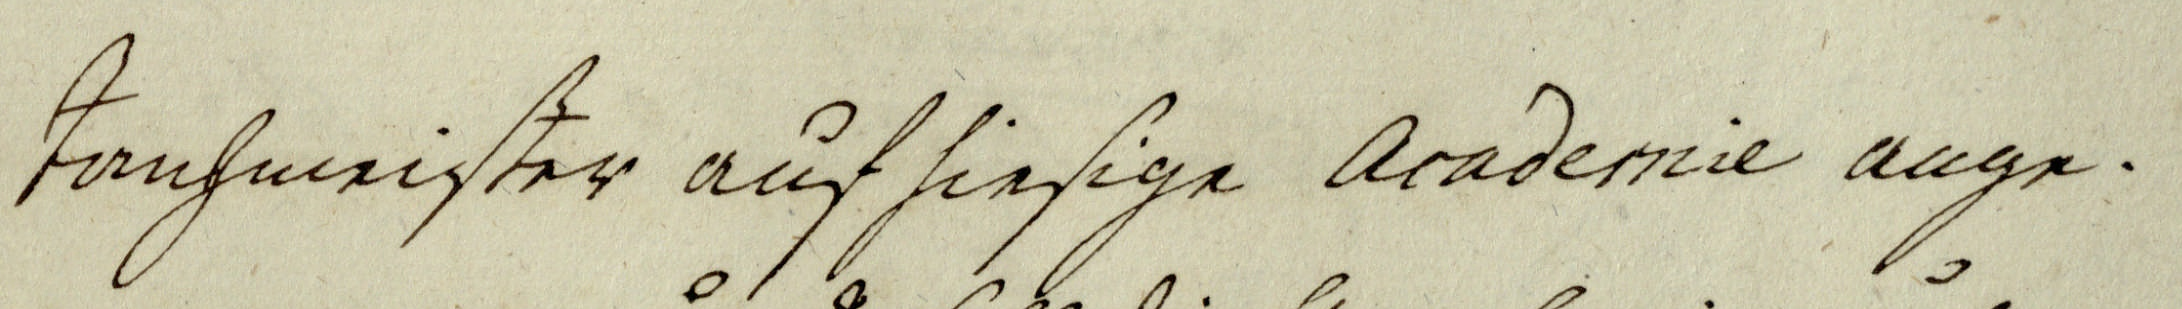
Tanzmeister auf hiesige Academie ange¬
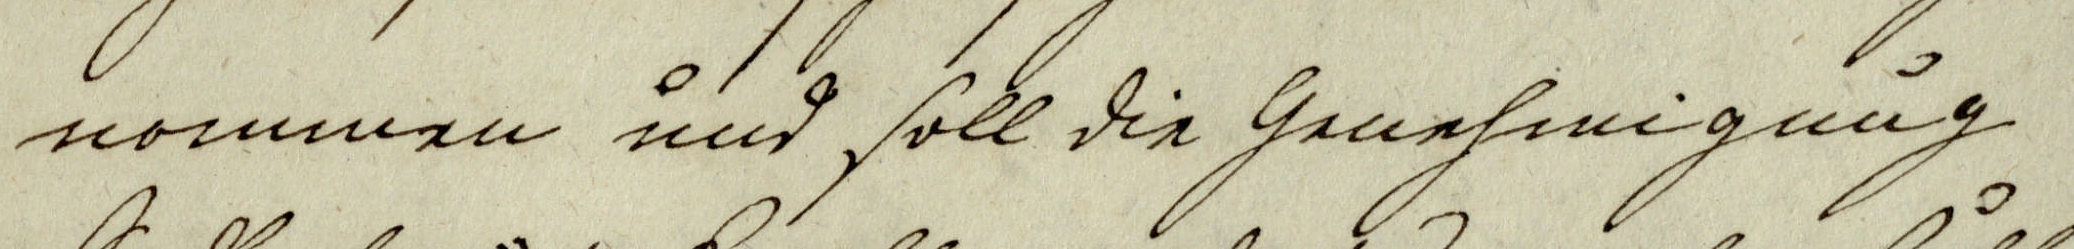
nommen und soll die Genehmigung
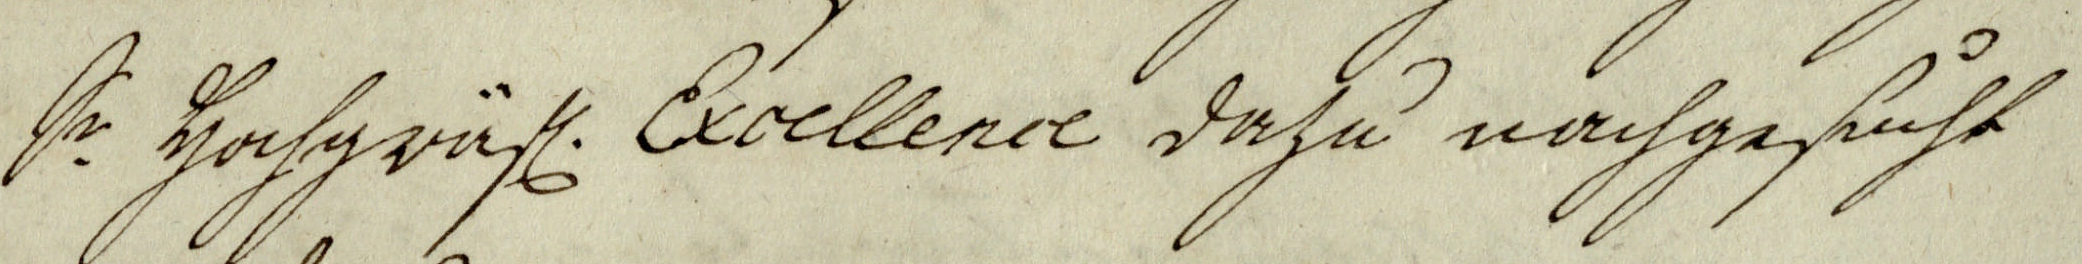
Sr Hochgräfl. Excellence dazu nachgesucht
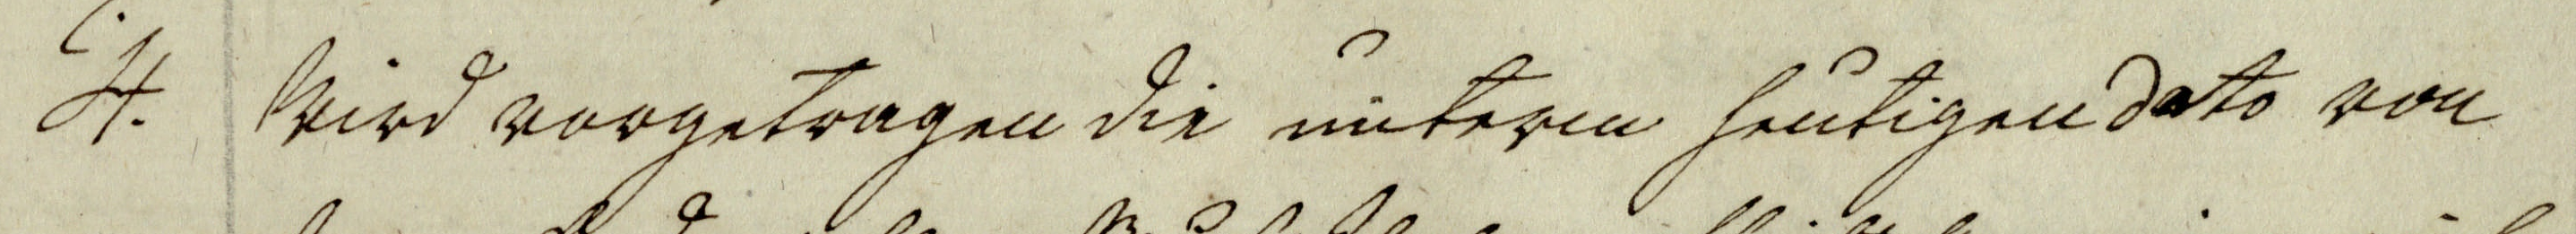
4. Wird vorgetragen die unterm heutigen dato von
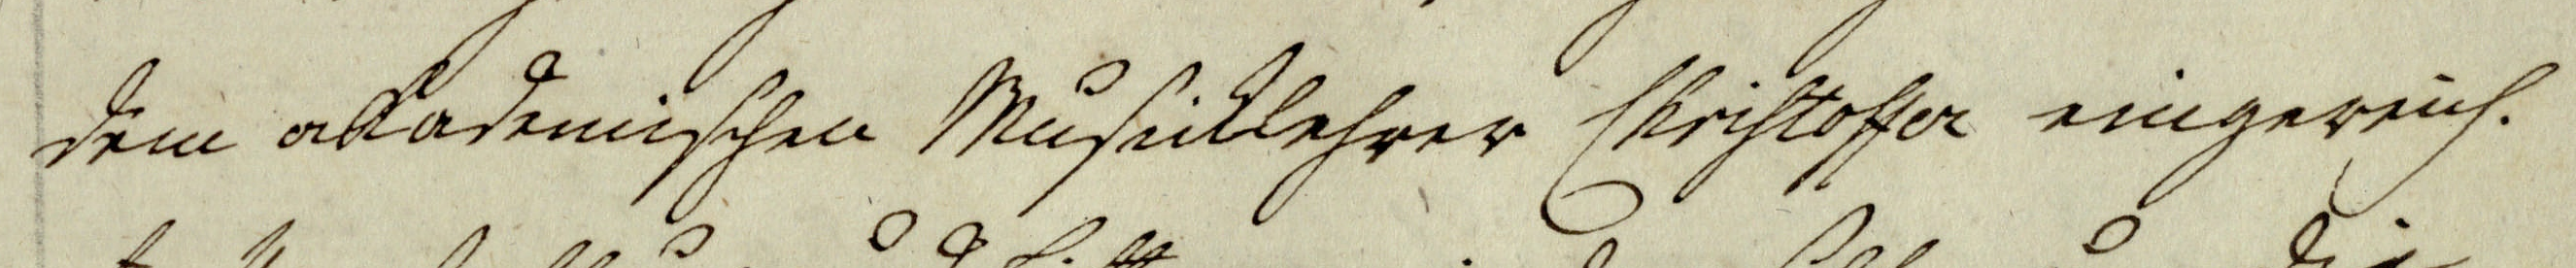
dem akademischen Musicklehrer Christoffer eingereich¬
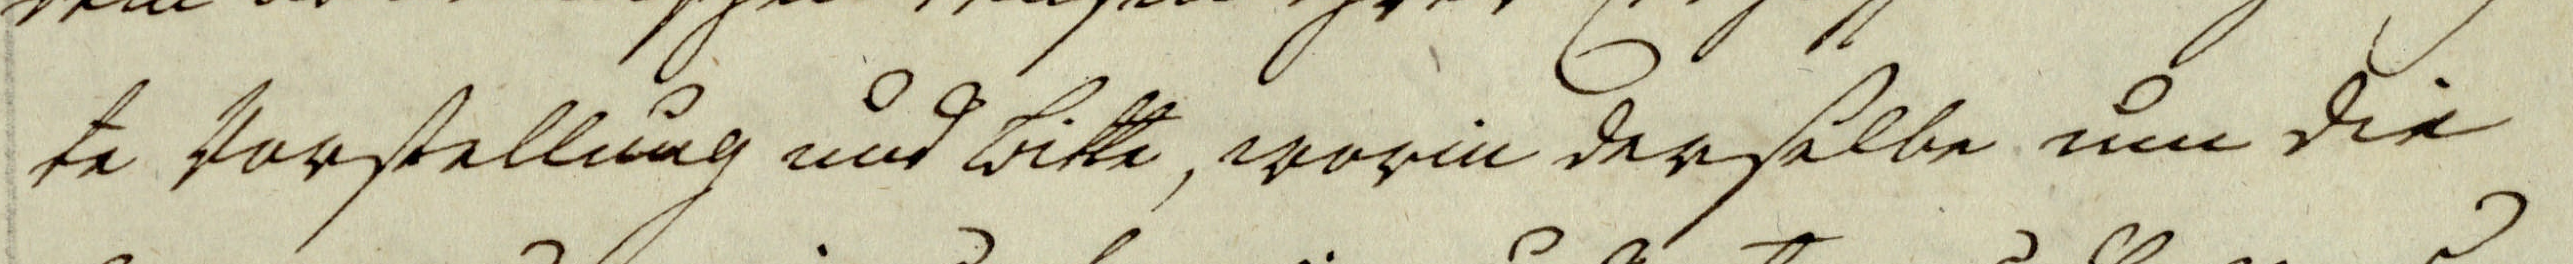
te Vorstellung und Bitte, worin derselbe um die
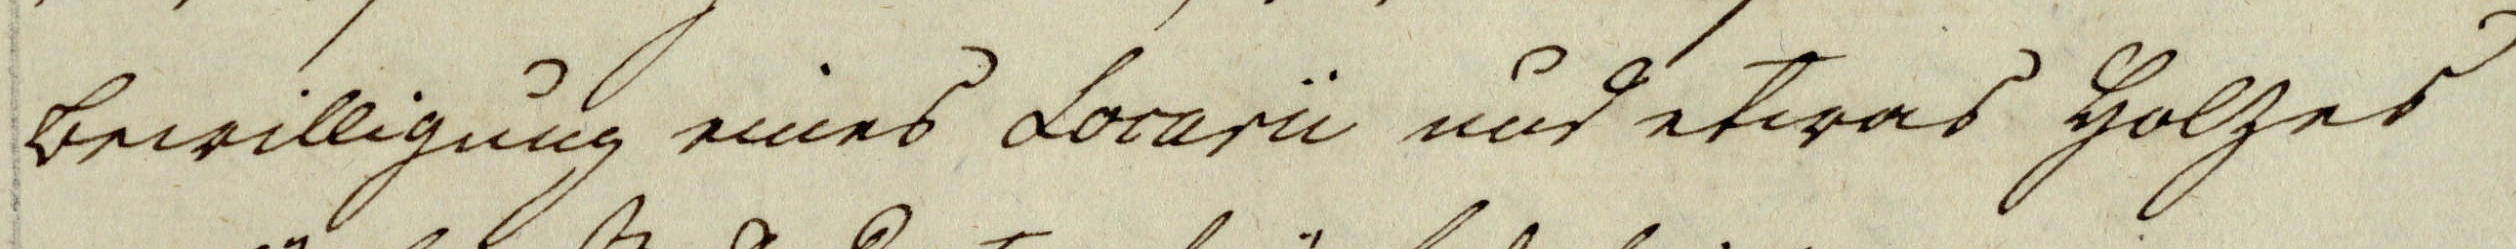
Bewilligung eines Locarii und etwas Holzes
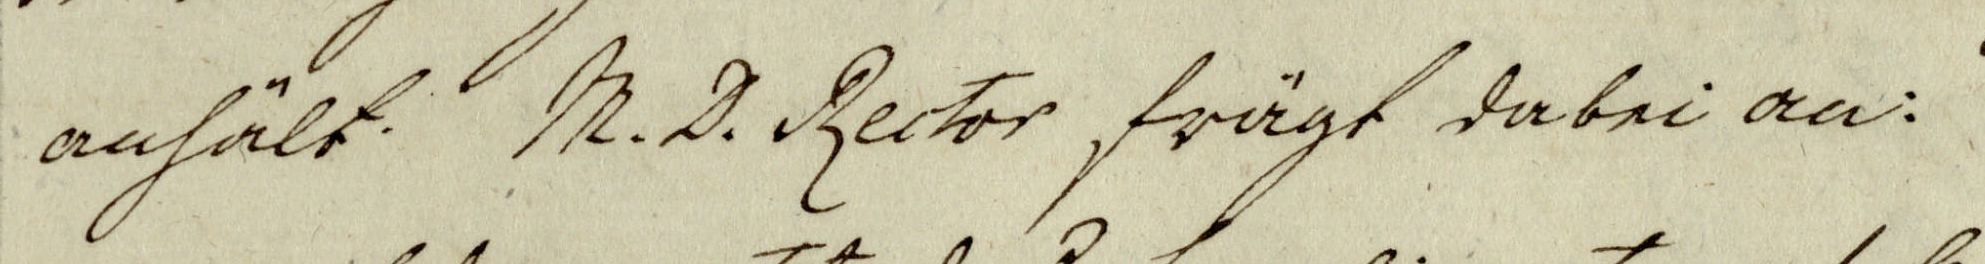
anhält. M. D. Rector frägt dabei an:
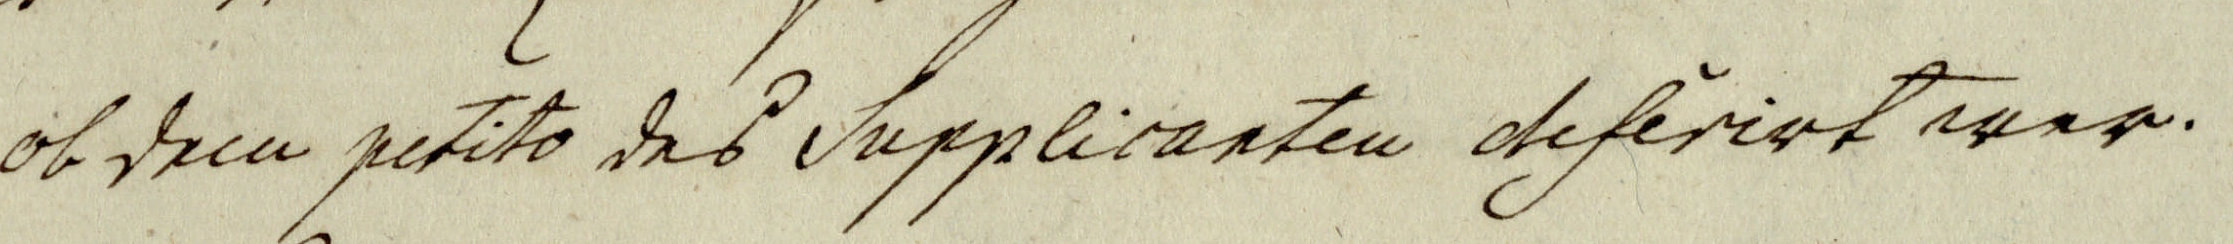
ob dem petito des Supplicanten deferirt wer¬
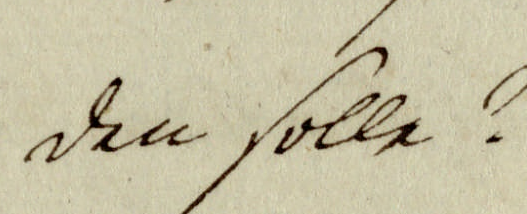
den solle?
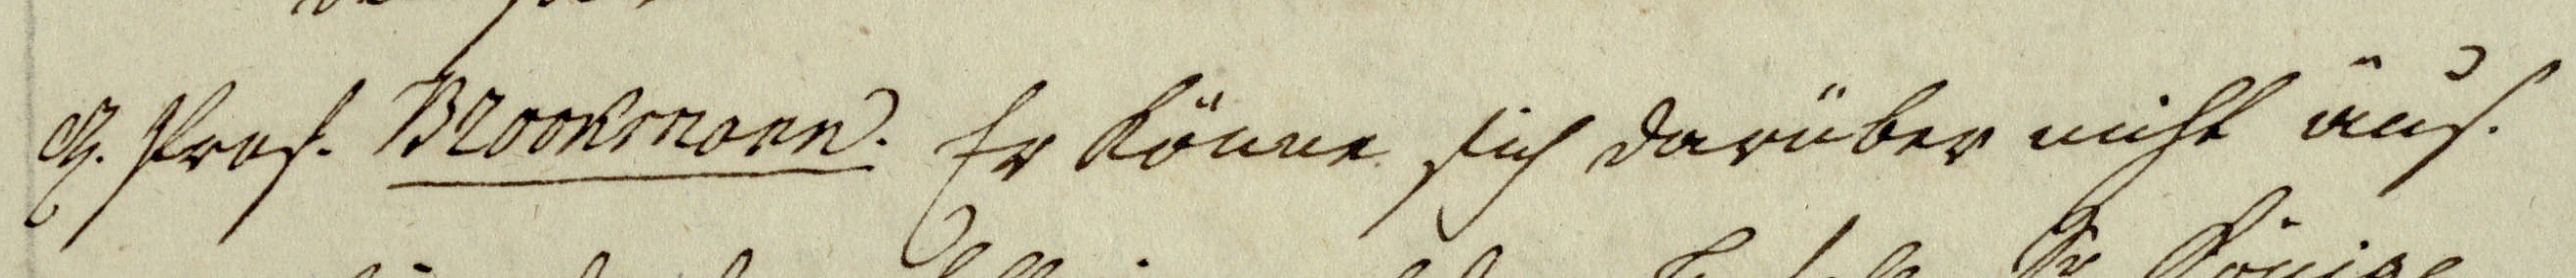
dh. Prof. Brockmann. Er könne sich darüber nicht äus¬
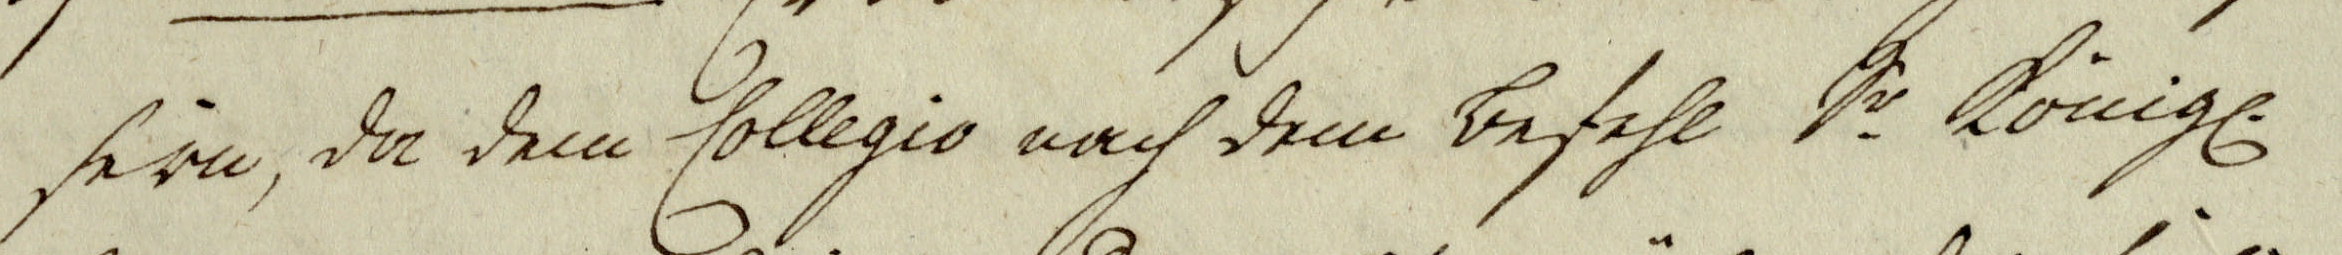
sern, da dem Collegio nach dem Befehl Sr Königl.
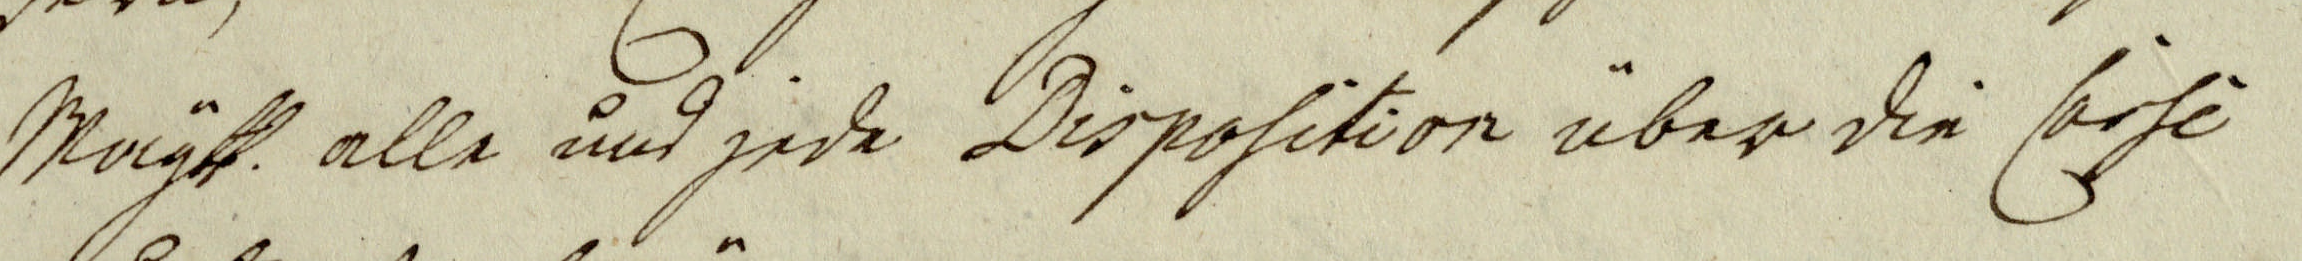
Maÿtt. alle und jede Disposition über die Casse
